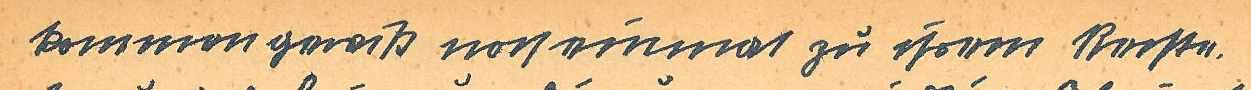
kommen gewiß noch einmal zu ihrem Rechte.
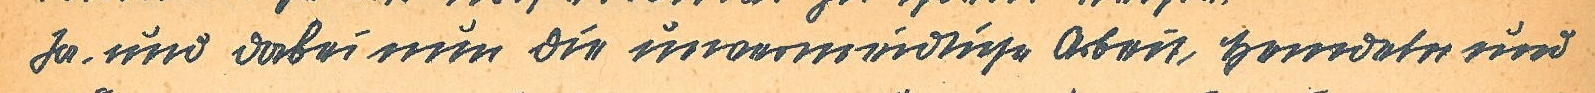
Ja, und dabei nun die unvermeidliche Arbeit, Hemdeln und
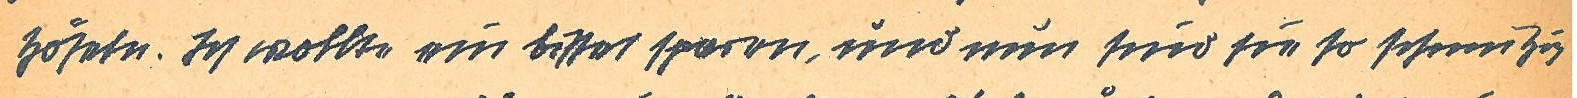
Höseln. Ich wollte ein bissel sparen, und nun sind sie so schmutzig
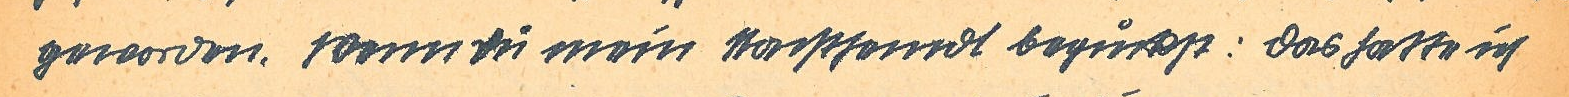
geworden. Wenn Du mein Nachthemd beguckst: das hatte ich
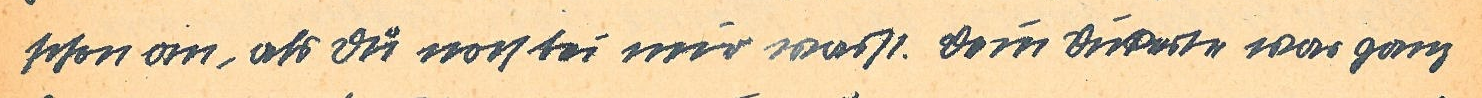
schon an, als Du noch bei mir warst. Dein Dickerle war ganz
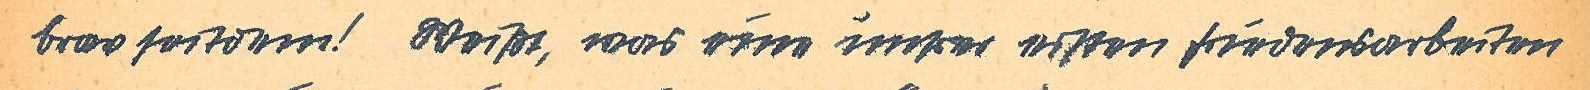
brav seitdem! Weißt, was eine unsrer ersten Friedensarbeiten
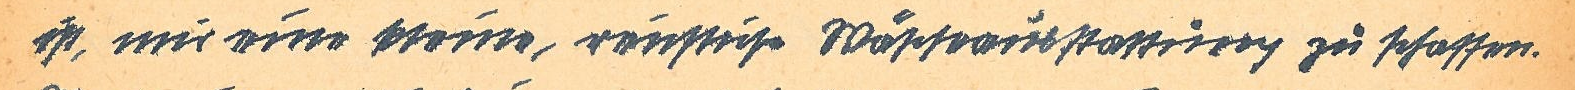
ist, mir eine kleine, reichliche Wäscheausstattung zu schaffen.
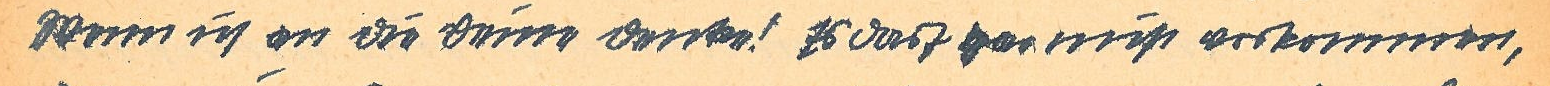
Wenn ich an die Deine denke! Es darf gar nicht vorkommen,
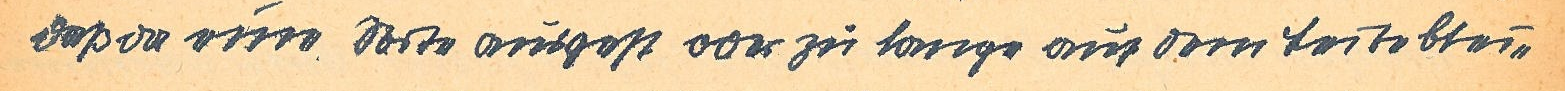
daß da eine Sorte ausgeht oder zu lange auf dem Leibe blei¬
